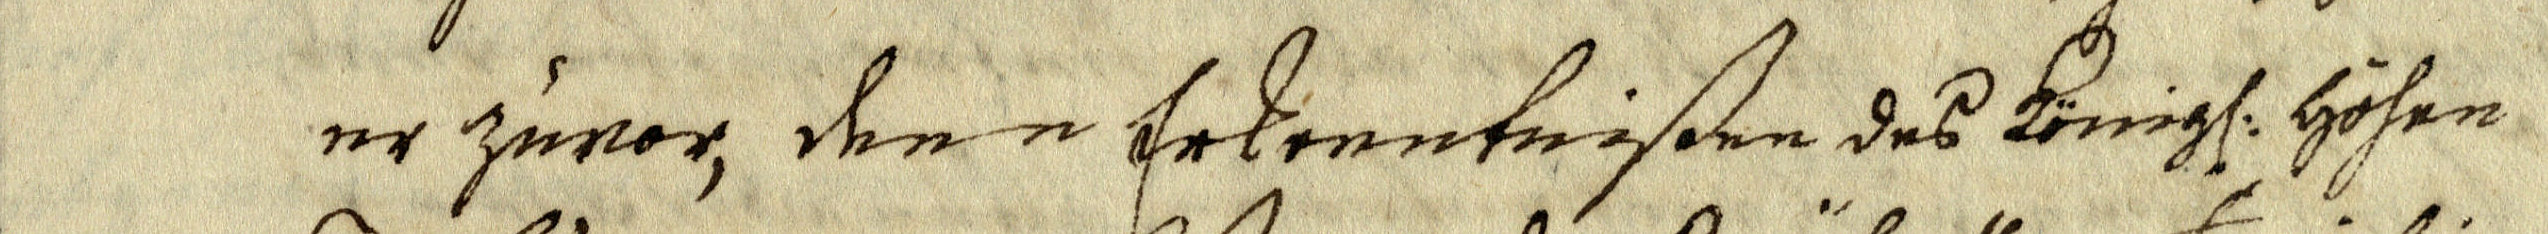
er zuvor, dennErkenntnißen des Königl. Hohen
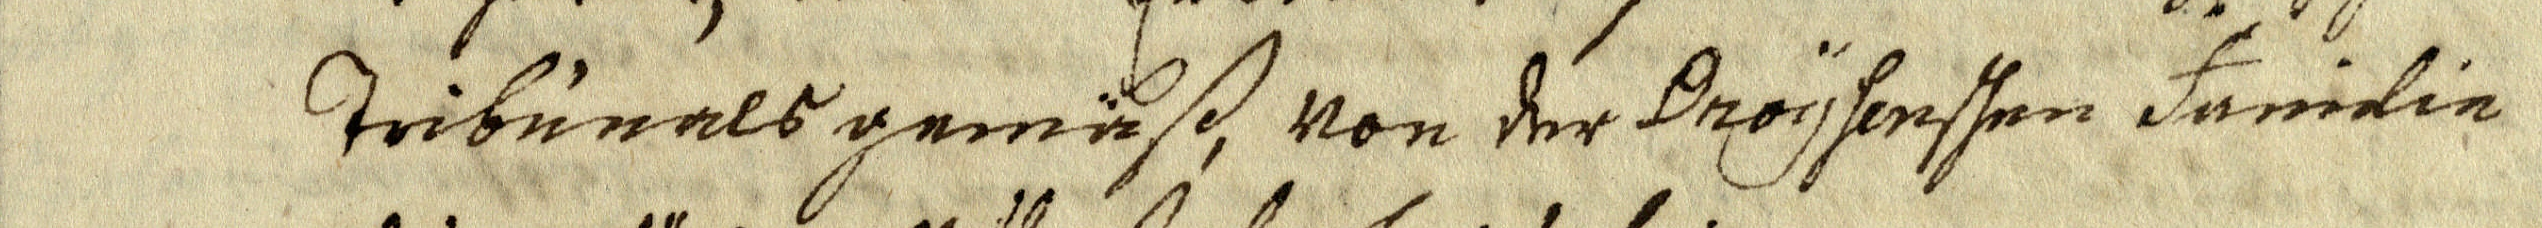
Tribunals gemäß, von der Droÿsenschen Familie
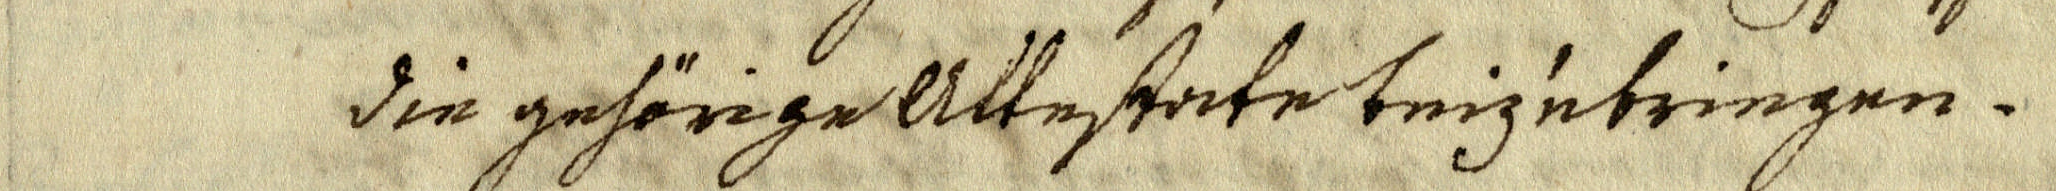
die gehörige Attestate beizubringen.
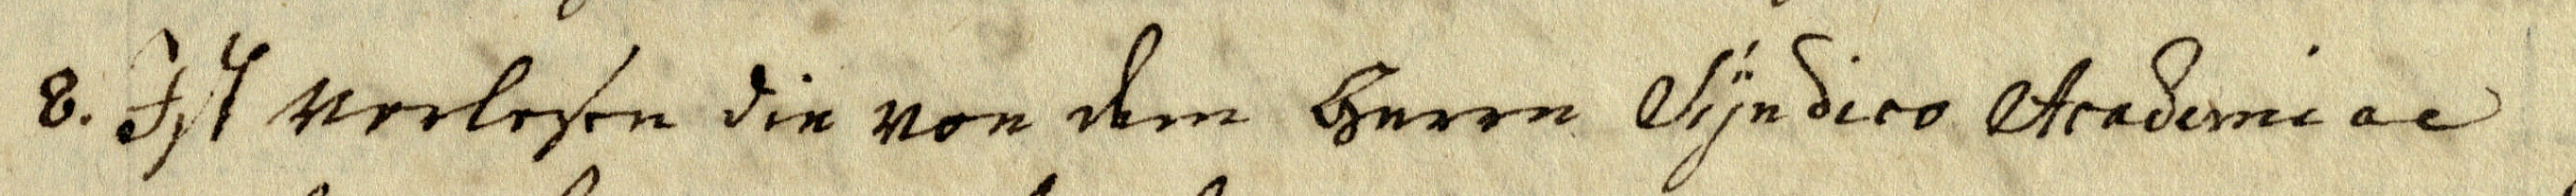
8. Ist verlesen die von dem Herrn Sÿndico Academiae
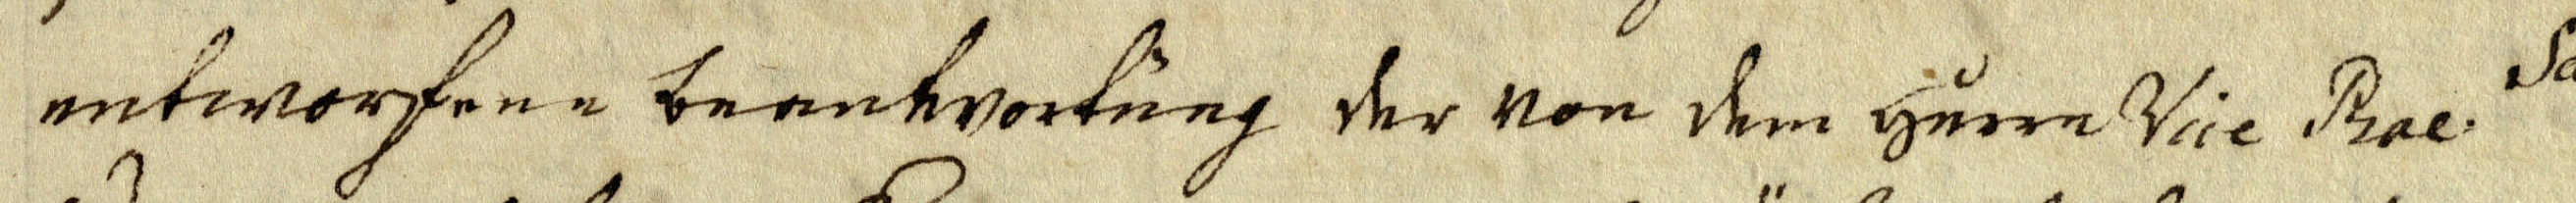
entworfene Beantwortung der von dem Herrn Vice Prae¬
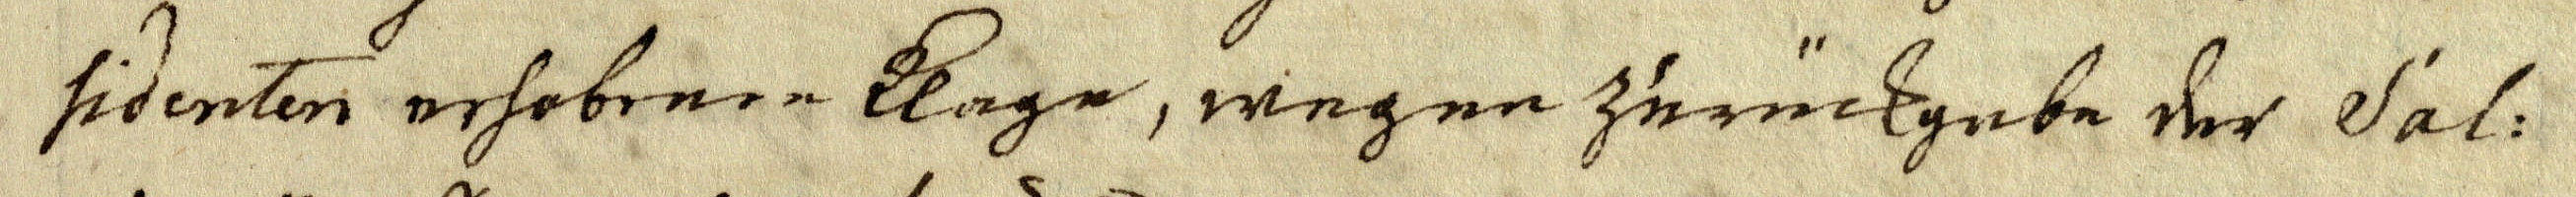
sidenten erhobenen Klage, wegen Zurückgabe der Sal¬
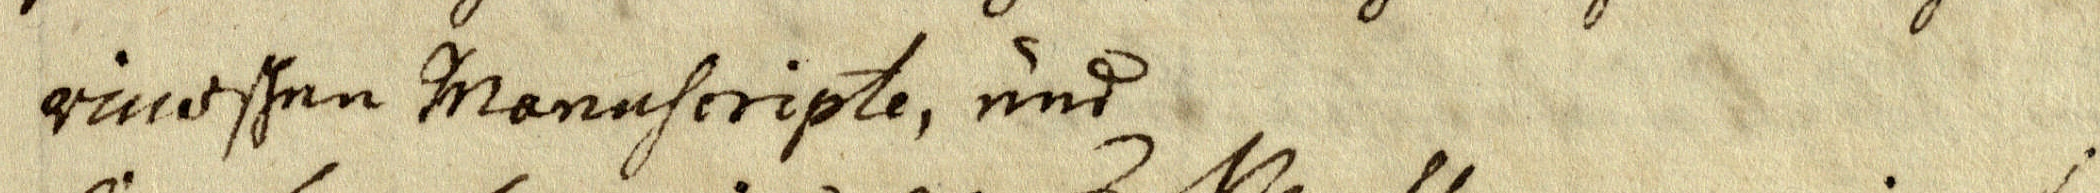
viusschen Manuscripte, und
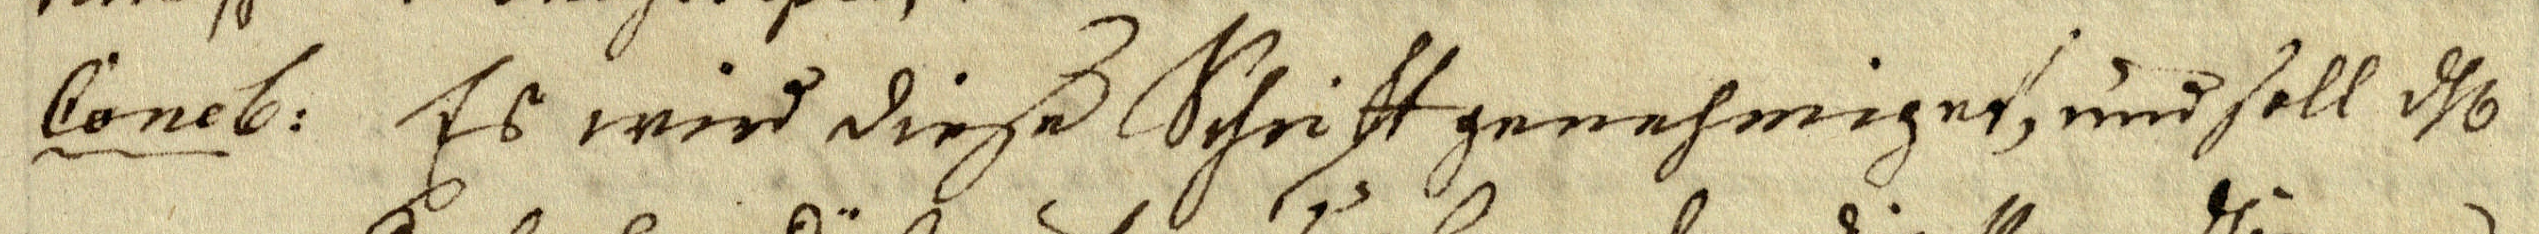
Concl. Es wird diese Schrift genehmiget, und soll dh
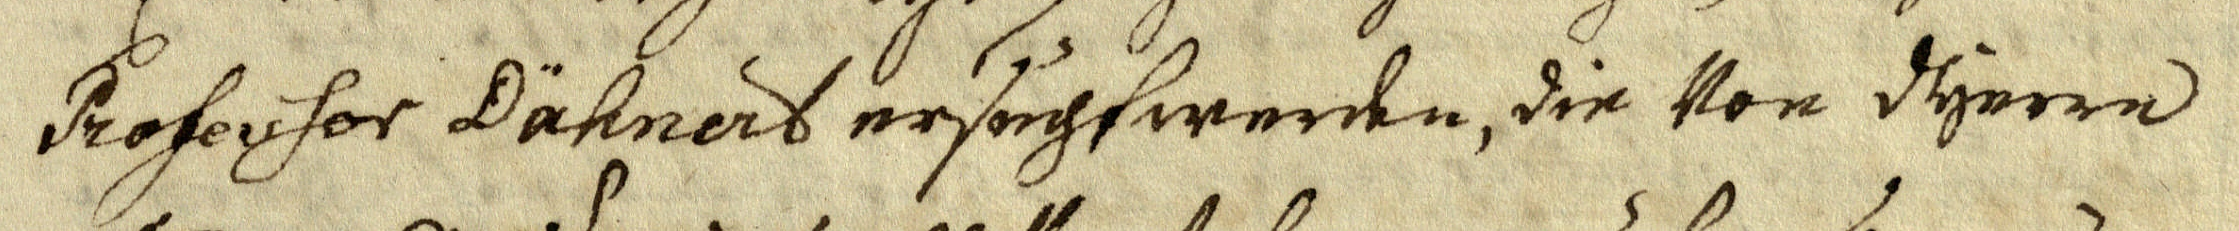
Professor Dähnert ersucht werden, die von d Herrn
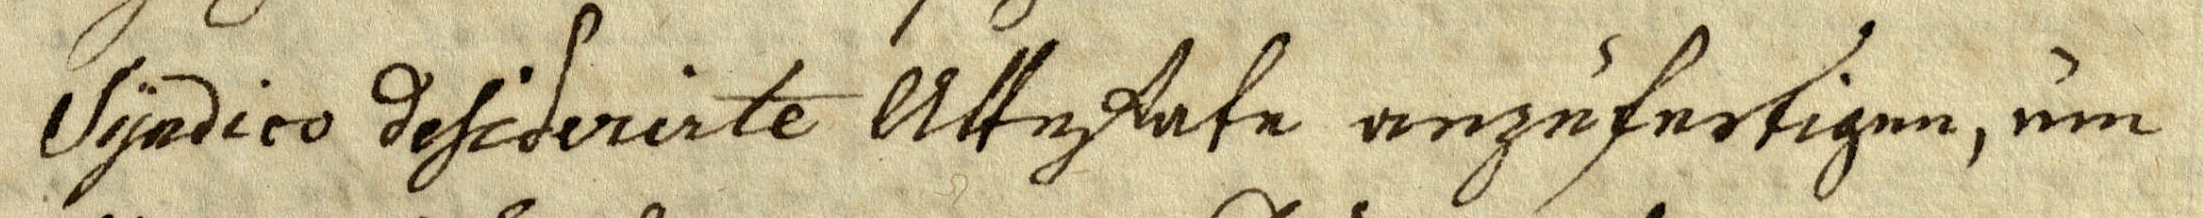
Sÿndico desiderirte Attestate anzufertigen, um
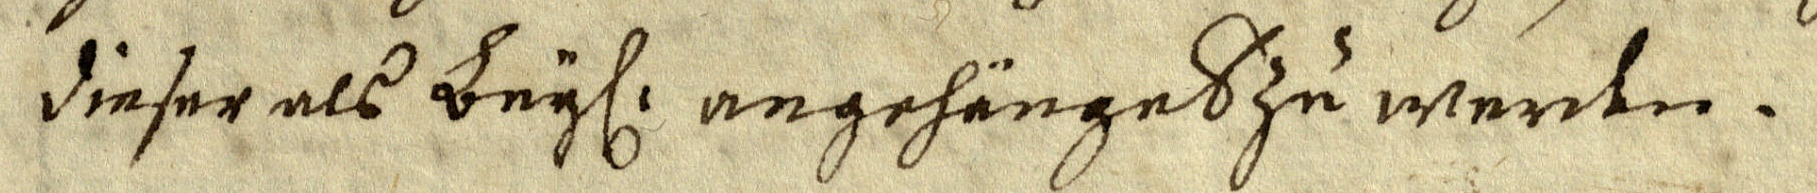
dieser als Beÿl. angehänget zu werden.
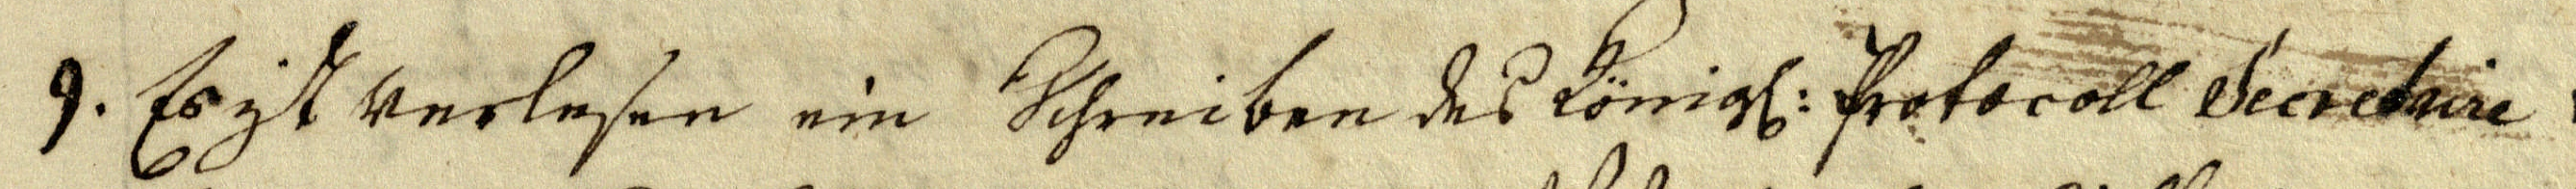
9. Es ist verlesen ein Schreiben des Königl. Protocoll Secretaire
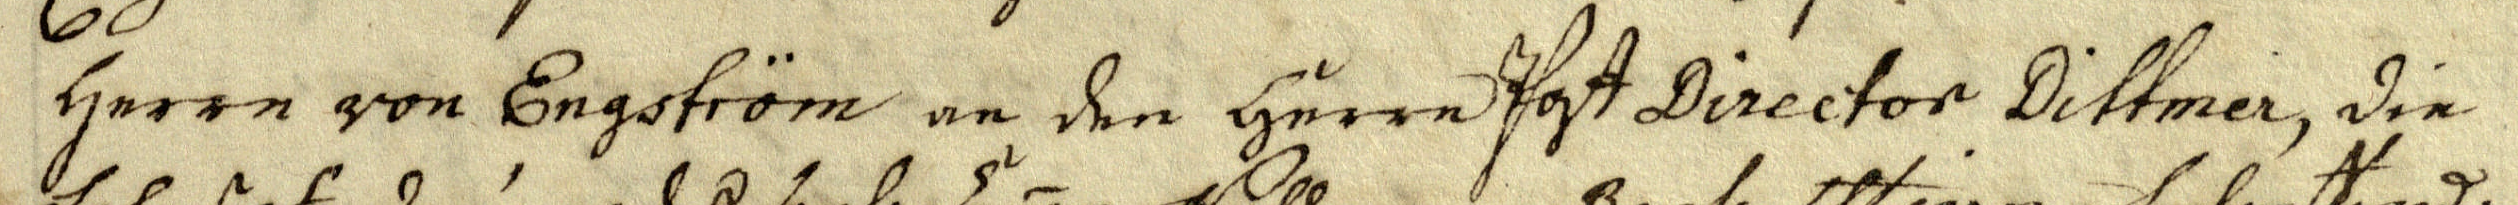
Herrn von Engström an den Herrn Post Director Dittmer, die
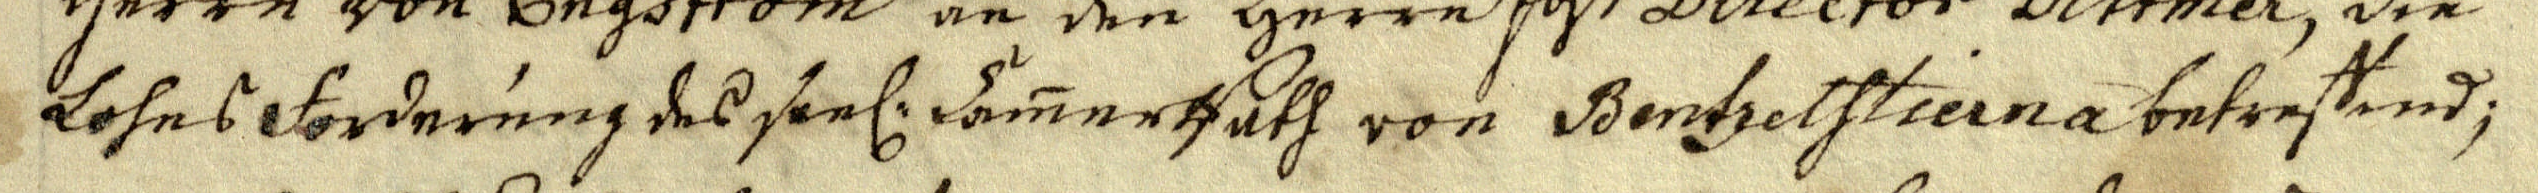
Lohns Forderung des seel. CammerRath von Bentzelstierna betreffend,
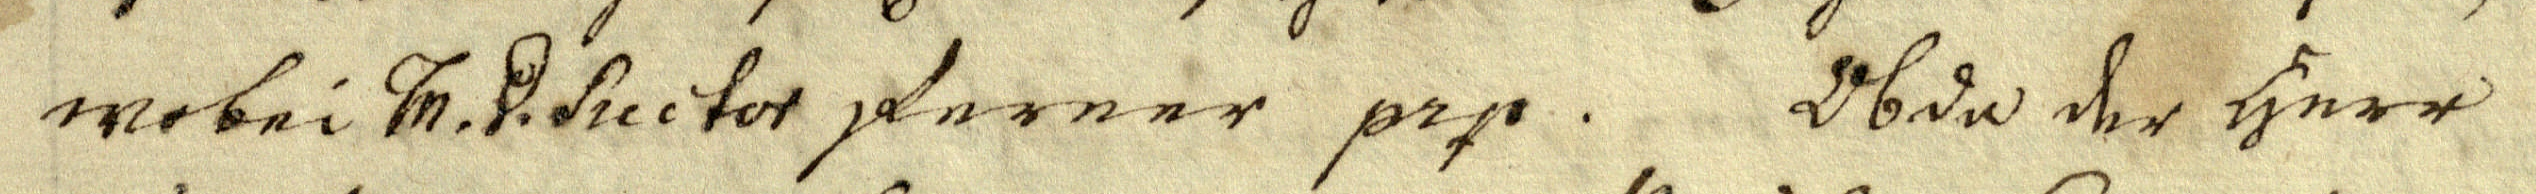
wobei M. D. Rector ferner prp. Ob da der Herr
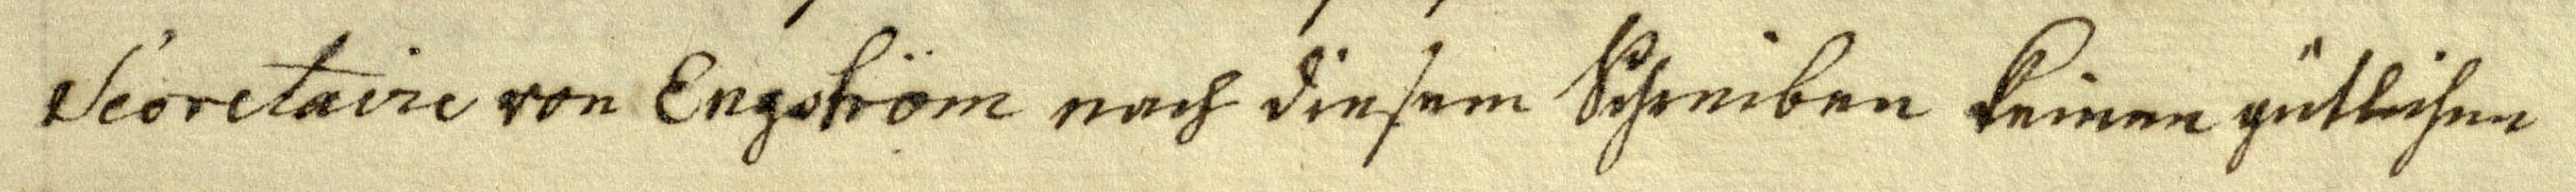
Secretaire von Engströmnach diesem Schreiben keinen gütlichen
